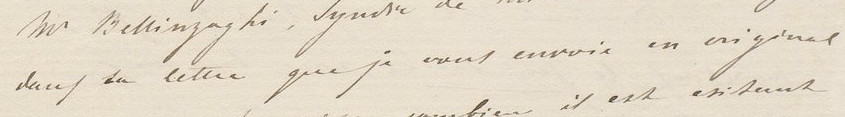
dans sa lettre que je vous envoie en original
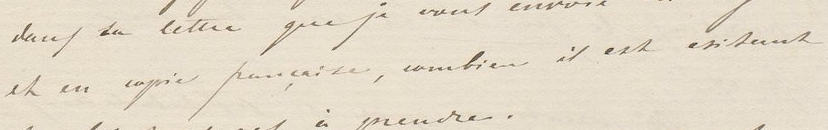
et en copie française, combien il est esitant
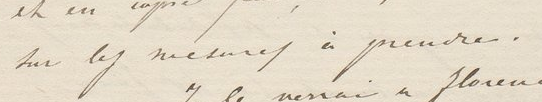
sur les mesures à prendre.
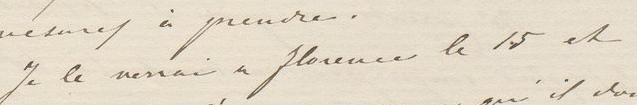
Je le verrai a Florence le 15 et
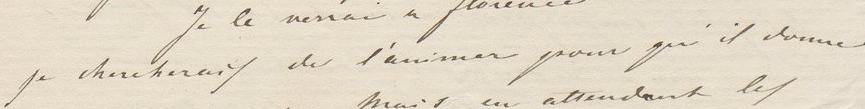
je chercherais de l'animer pour qu'il donne
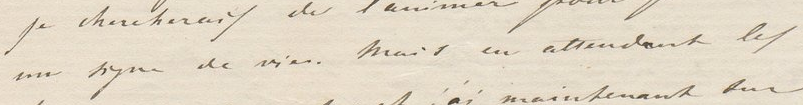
un signe de vie. Mais en attendant les
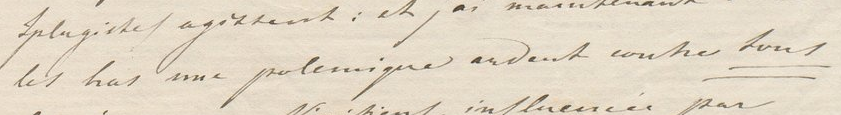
les bras une polemique ardent contre tous
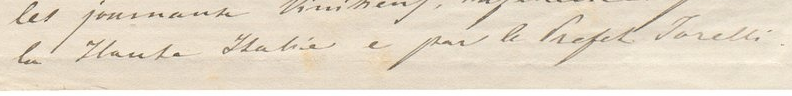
la Haute Italie & par le Prefet Torelli
